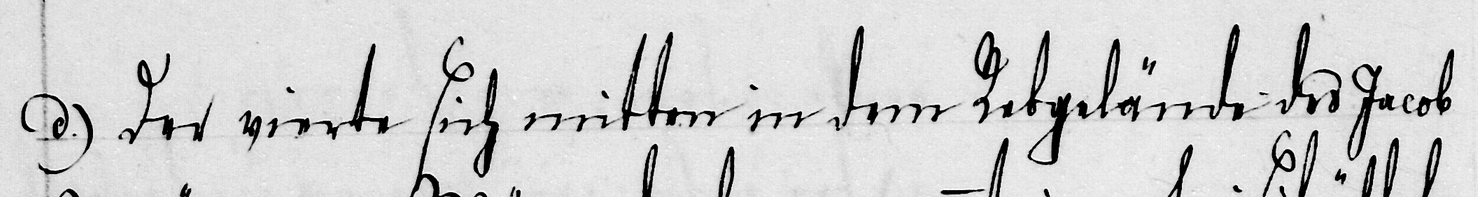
d.) Der vierte sich mitten in dem Rebgelände des Jacob
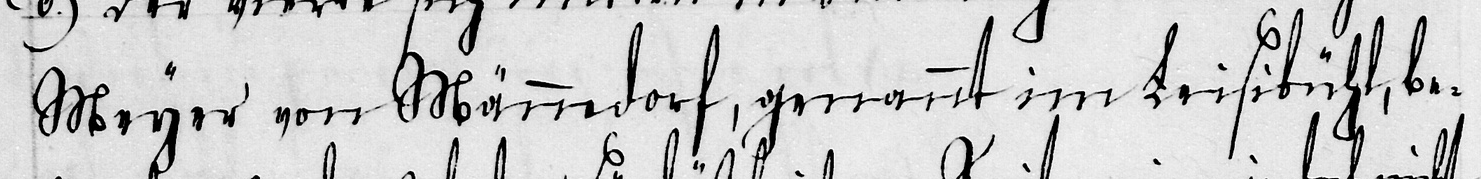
Meyer von Männedorf, genannt im Leisibühl, be¬
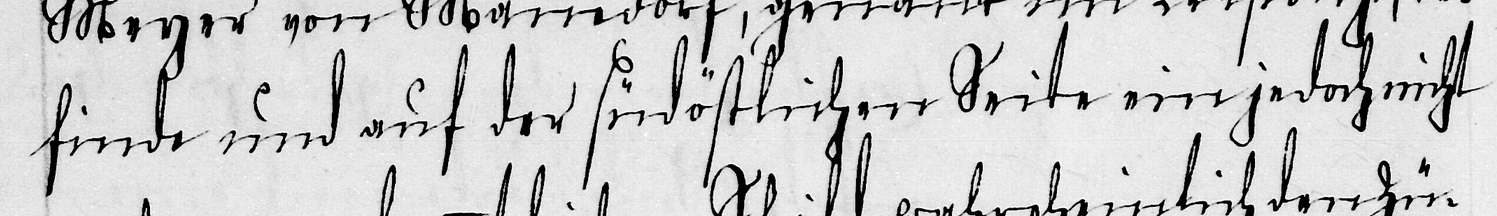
finde und auf der südöstlichen Seite ein jedoch nicht
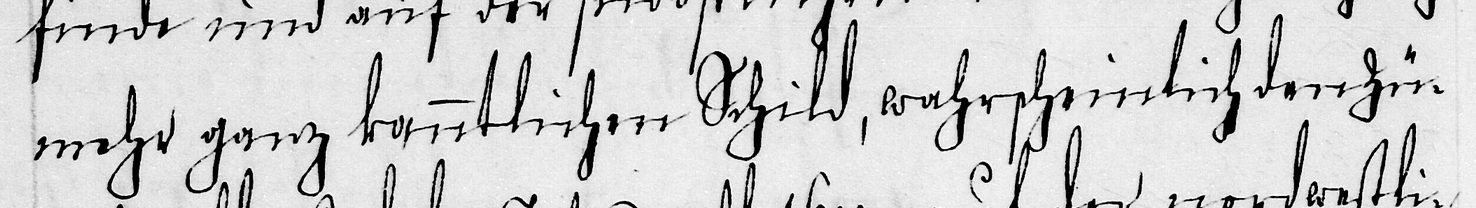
mehr ganz kanntlichen Schild, wahrscheinlich den Zü¬
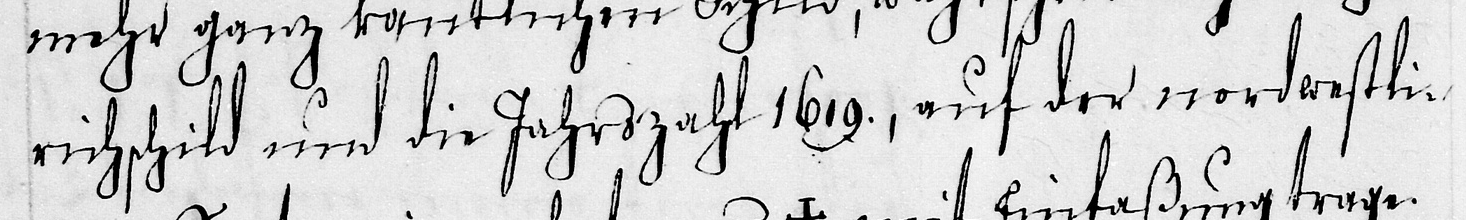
richschild und die Jahrszahl 1619., auf der nordwestli¬
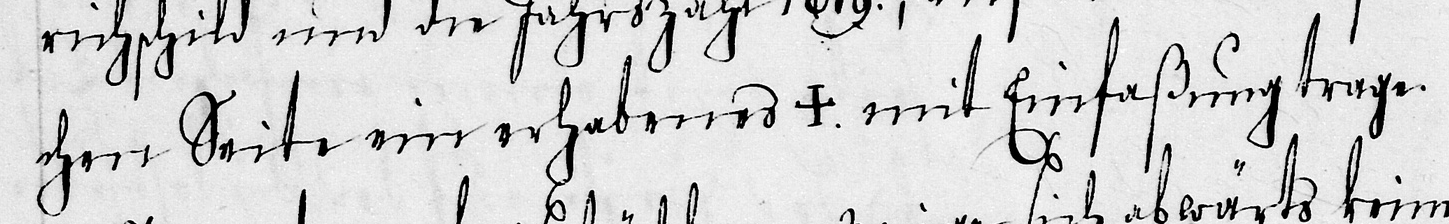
chen Seite ein erhabenes +. mit Einfaßung trage.
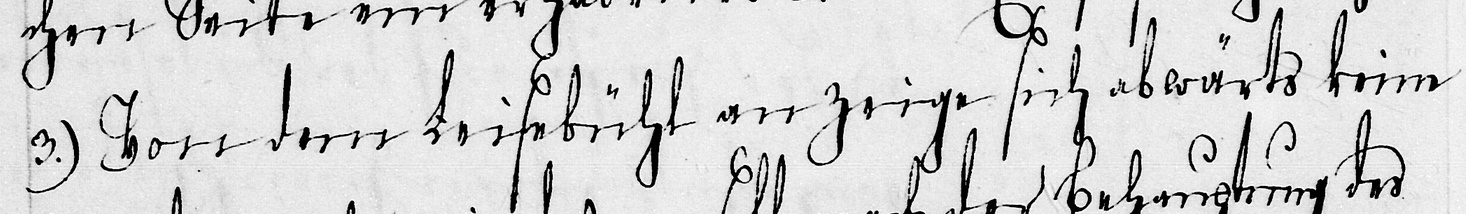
3.) Von dem Leisebühl an zeige sich abwärts keine
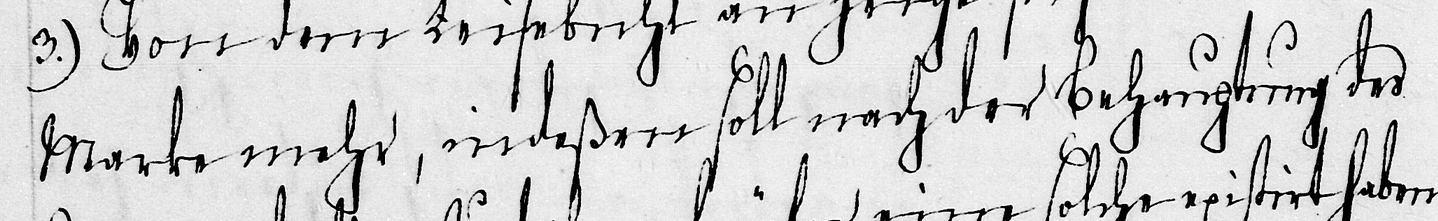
Marke mehr, indeßen soll nach der Behauptung des
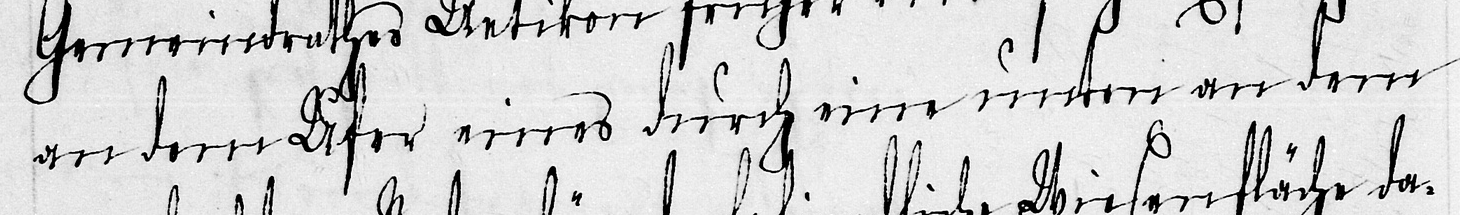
an dem Ufer eines durch eine unten an dem
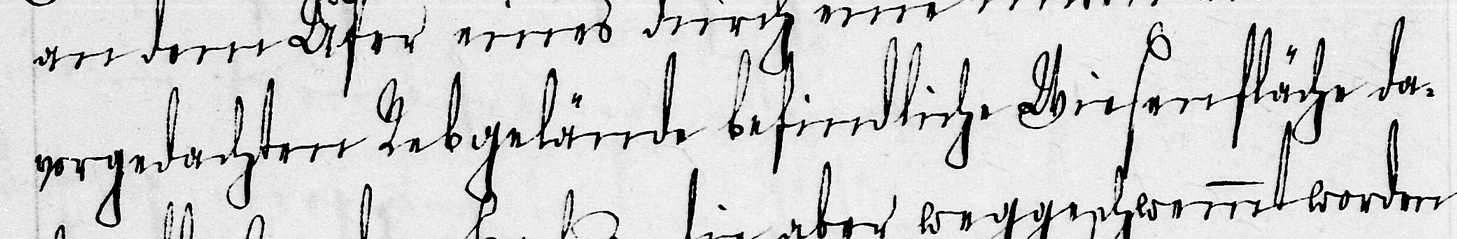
vorgedachten Rebgelände befindliche Wiesenfläche da¬
